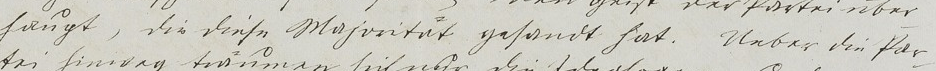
haupt, die diese Majorität gesandt hat. Ueber die Par-
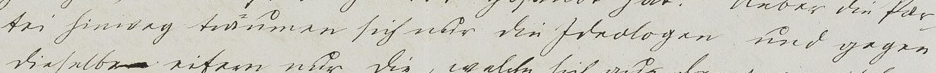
tei hinweg träumen sich nur die Ideologen und gegen
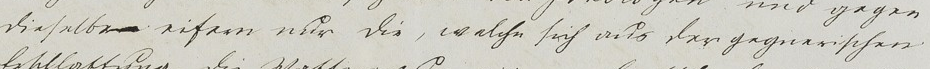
dieselben eifern nur die, welche sich aus der gegnerischen
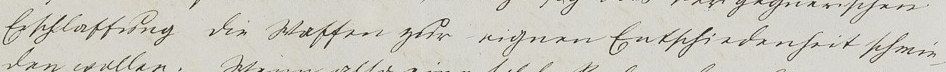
Erschlaffung die Waffen zur eignen Entschiedenheit schmie-
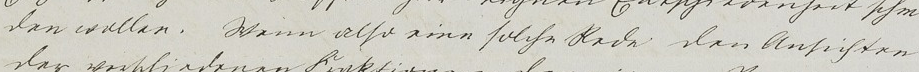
den wollen. Wenn also eine solche Rede den Ansichten
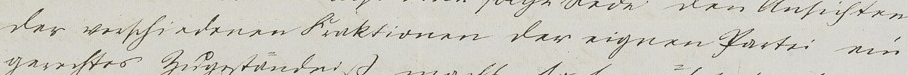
der verschiedenen Fraktionen der eignen Partei ein
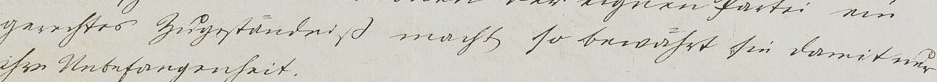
gerechtes Zugeständniß macht, so bewährt sie damit nur
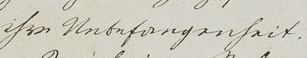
ihre Unbefangenheit.
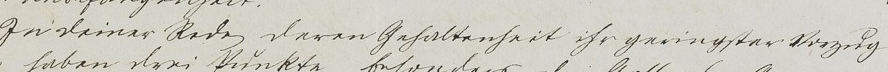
In deiner Rede, deren Gehaltenheit ihr geringster Vorzug
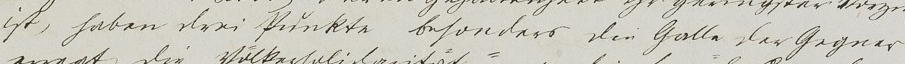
ist, haben drei Punkte besonders die Galle der Gegner
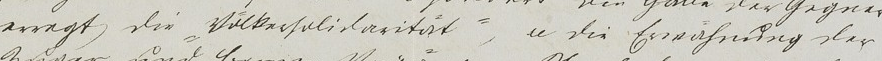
erregt, die «Völkersolidarität», & die Erwähnung der
